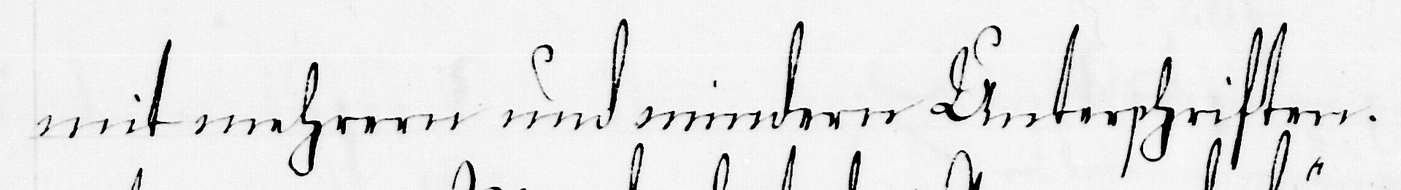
mit mehrern und mindern Unterschriften.
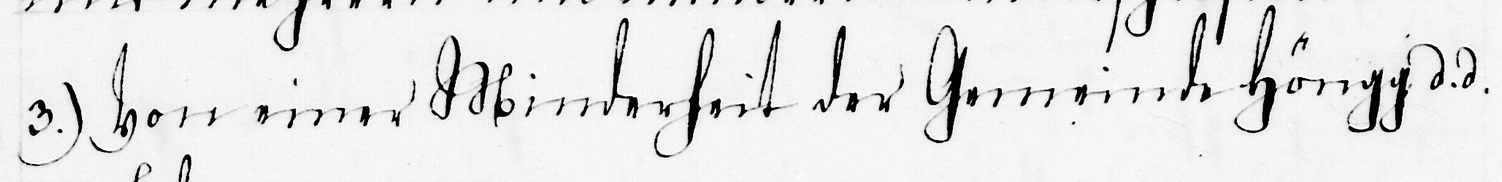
3.) Von einer Minderheit der Gemeinde Höngg d.
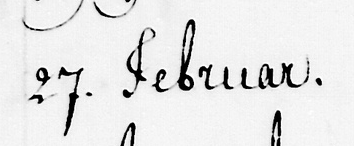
27. Februar.
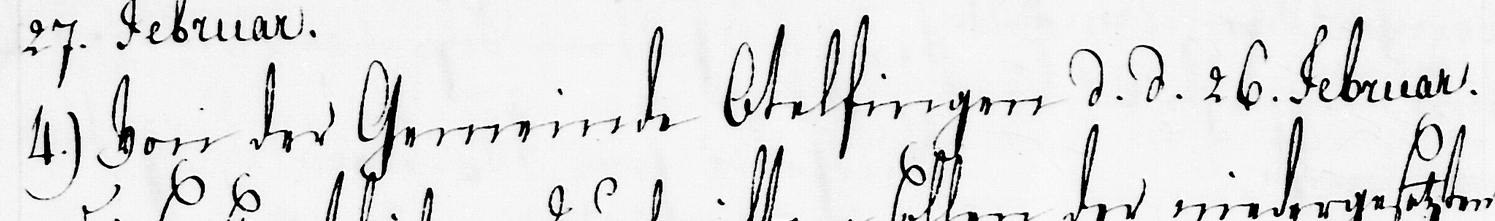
4.) Von der Gemeinde Otelfingen d. d. 26. Februar.
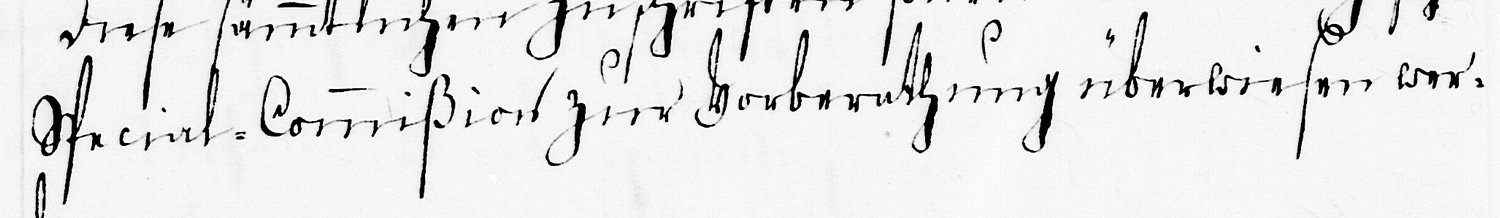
Special-Commißion zur Vorberathung überwiesen wer¬
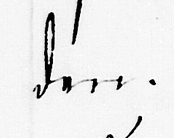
den.
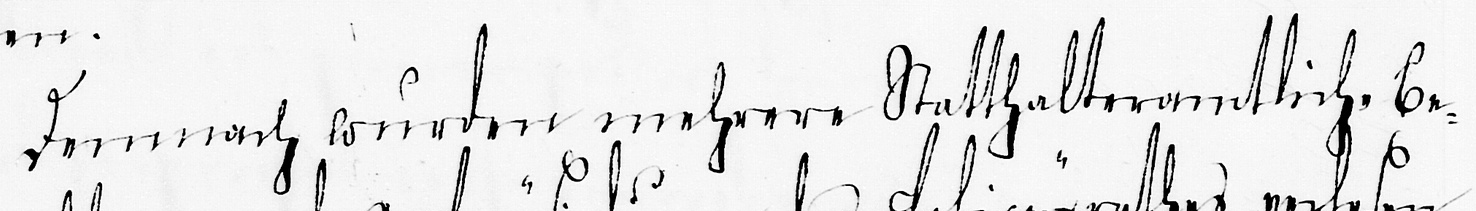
Demnach wurden mehrere Statthalteramtliche Be¬
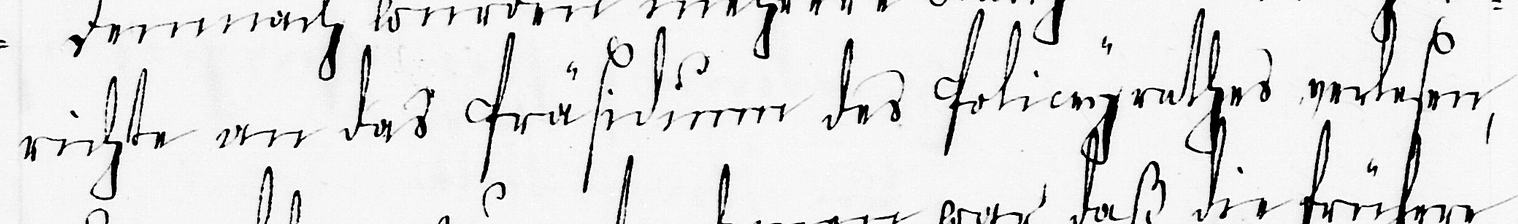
richte an das Präsidium des Policeyrathes verlesen,
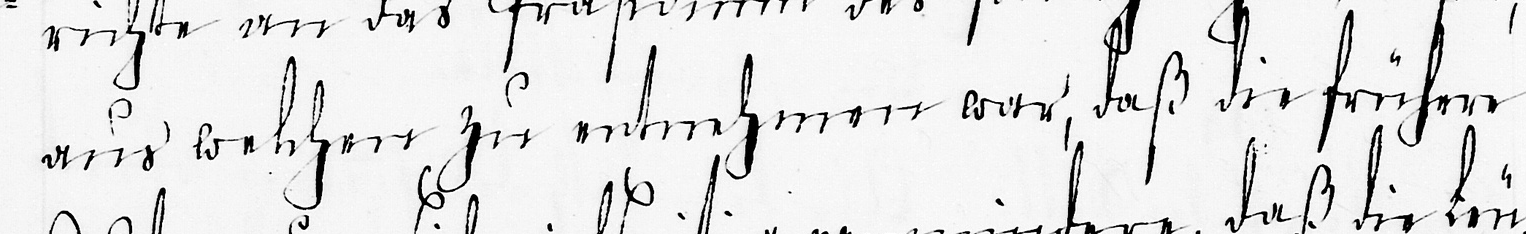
aus welchen zu entnehmen war, daß die frühere
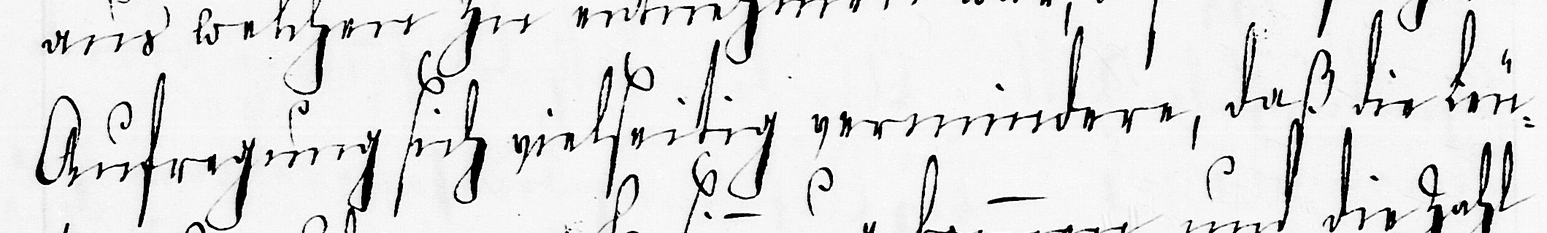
Aufregung sich vielseitig vermindere, daß die Leu¬
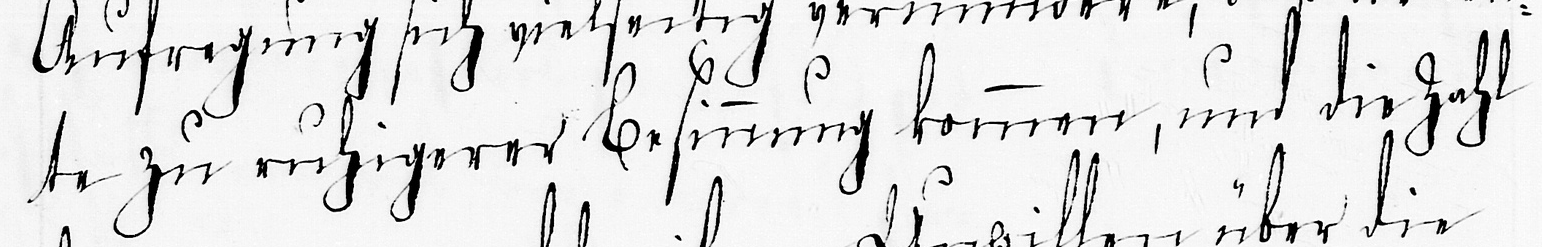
te zu ruhigerer Besinnung kommen, und die Zahl
